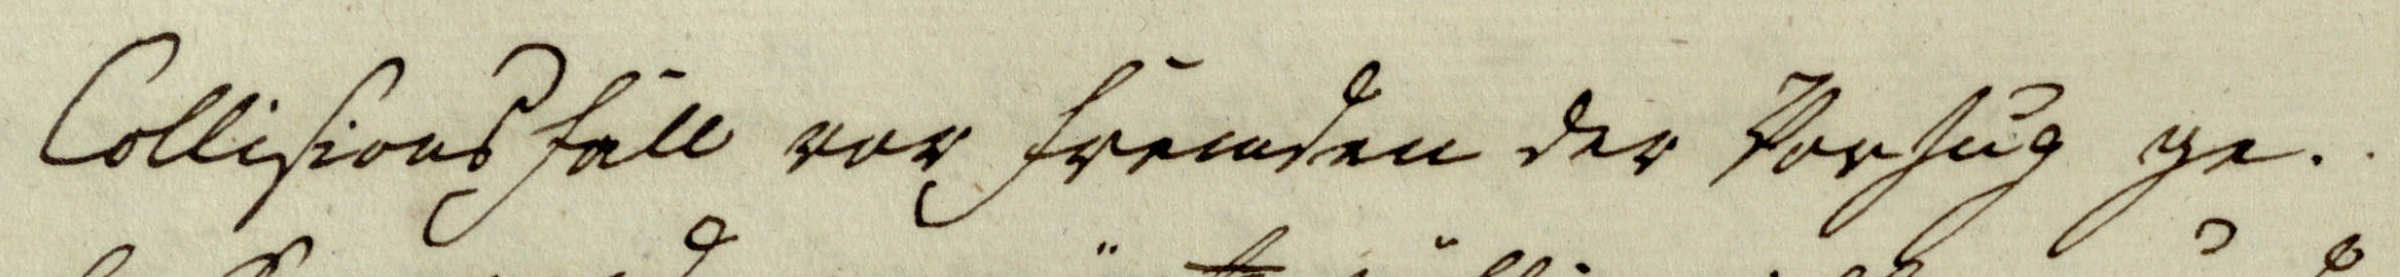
Collisions Fall vor Fremden der Vorzug ge¬
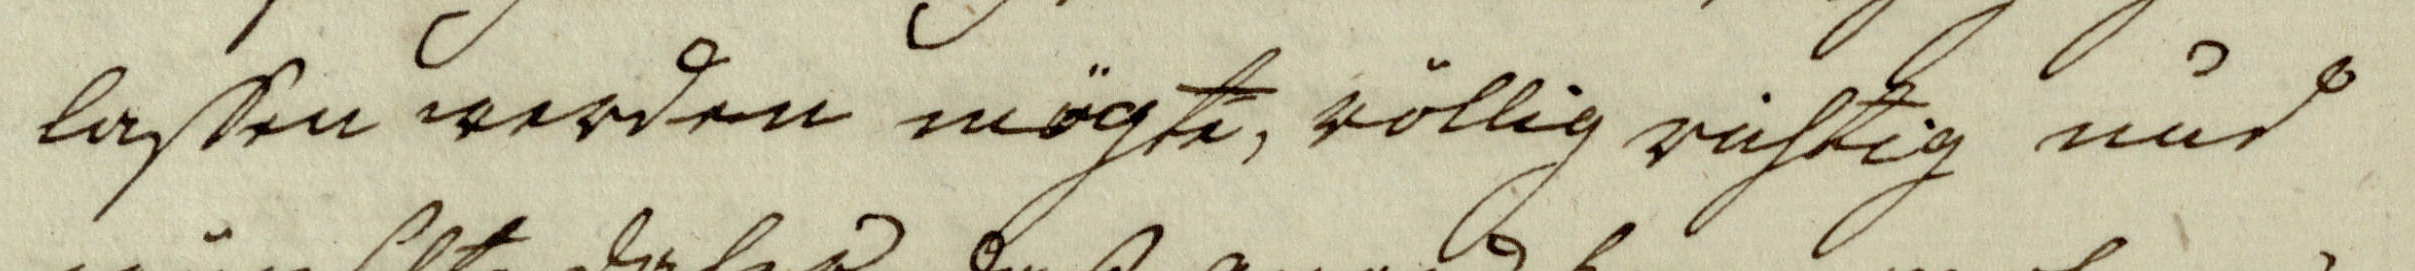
lassen werden möchte, völlig richtig und
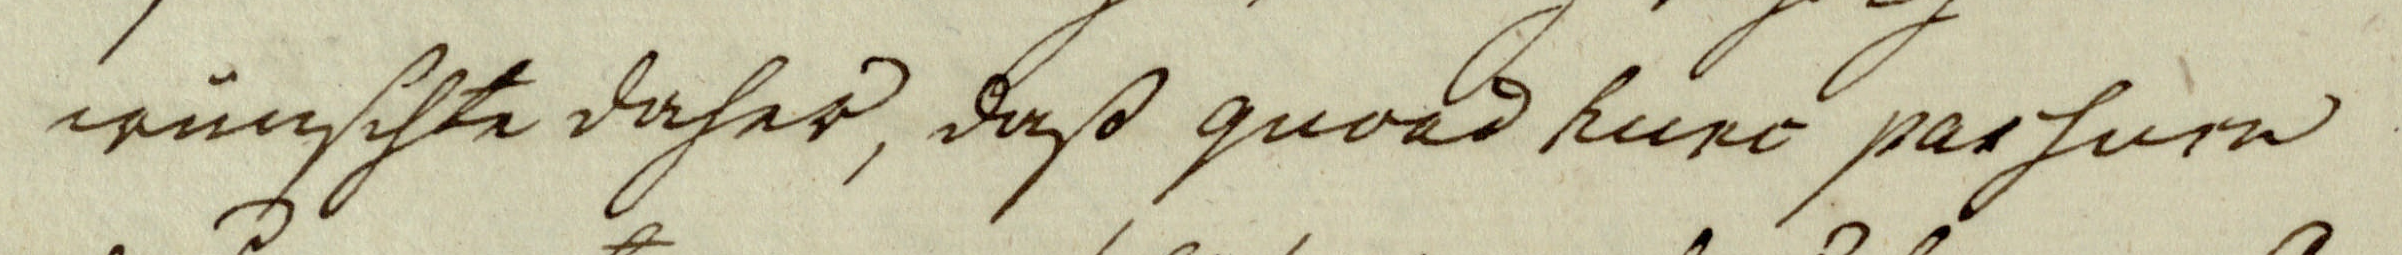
wünschte daher, daß quoad hunc passum
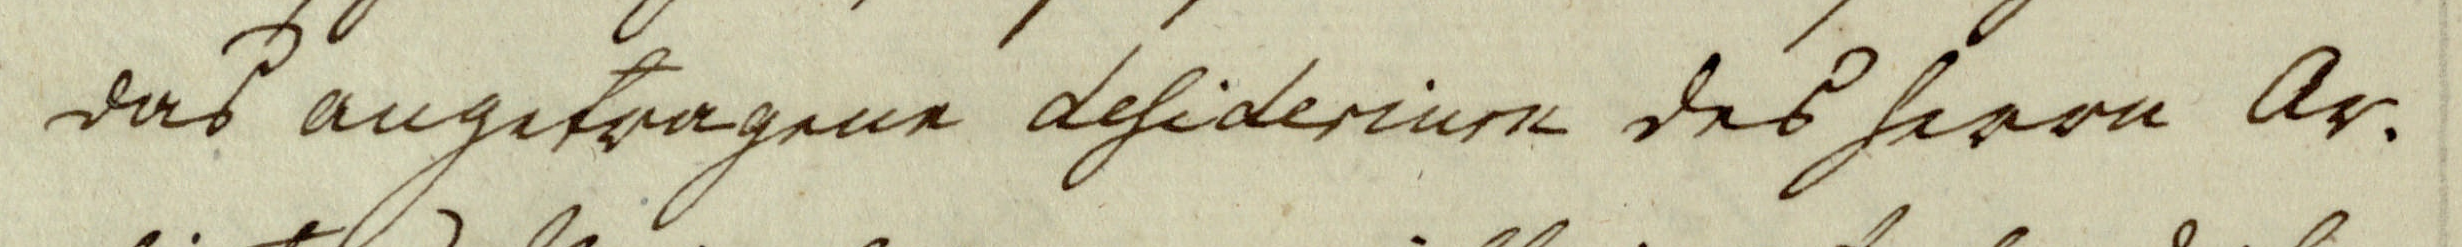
das angetragene desiderium des Herrn Ar¬
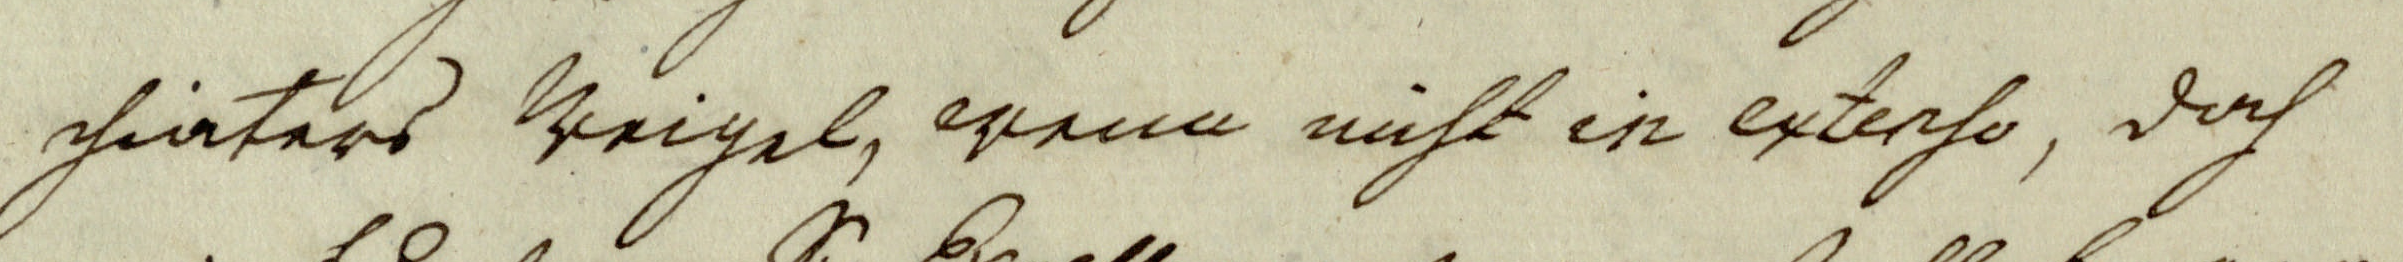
chiaters Weigel, wenn nicht in extenso, doch
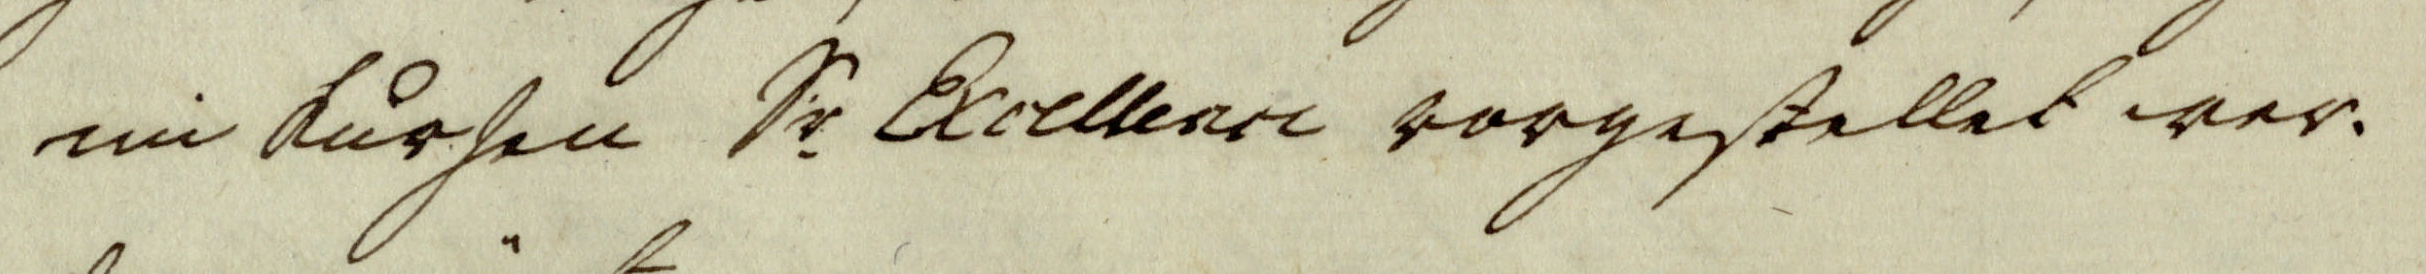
im kurzen Sr Excellence vorgestellet wer¬
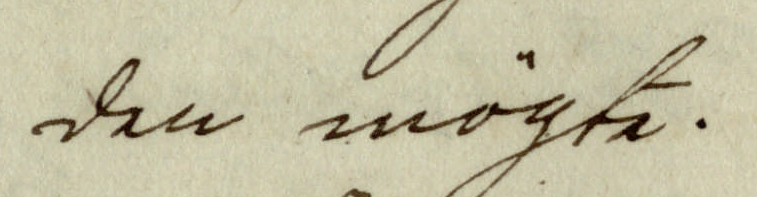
den mögte.
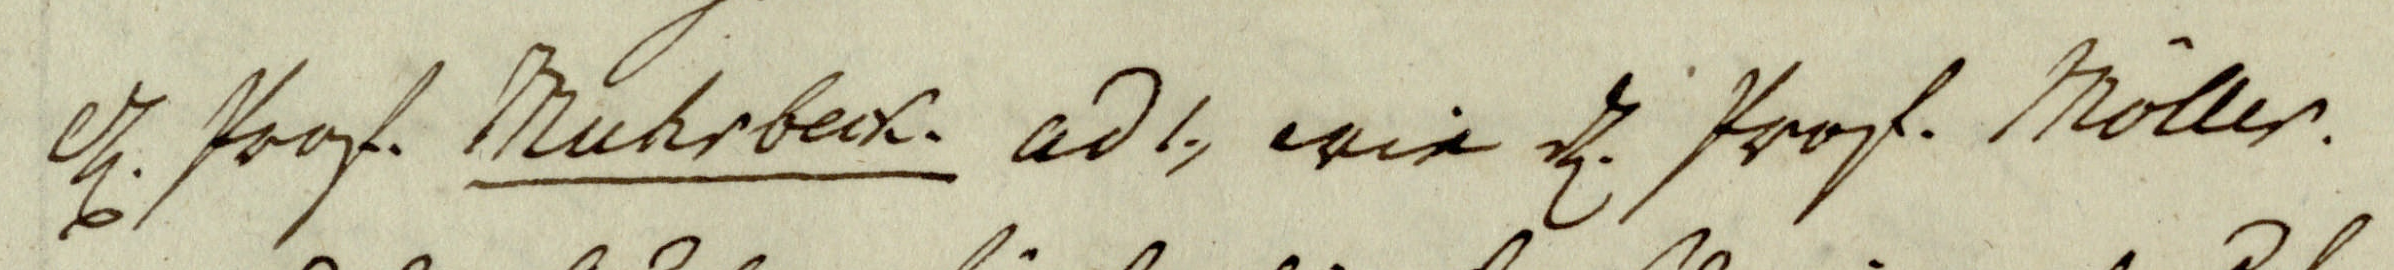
dh. Prof. Muhrbeck. ad 1., wie dh. Prof. Möller.
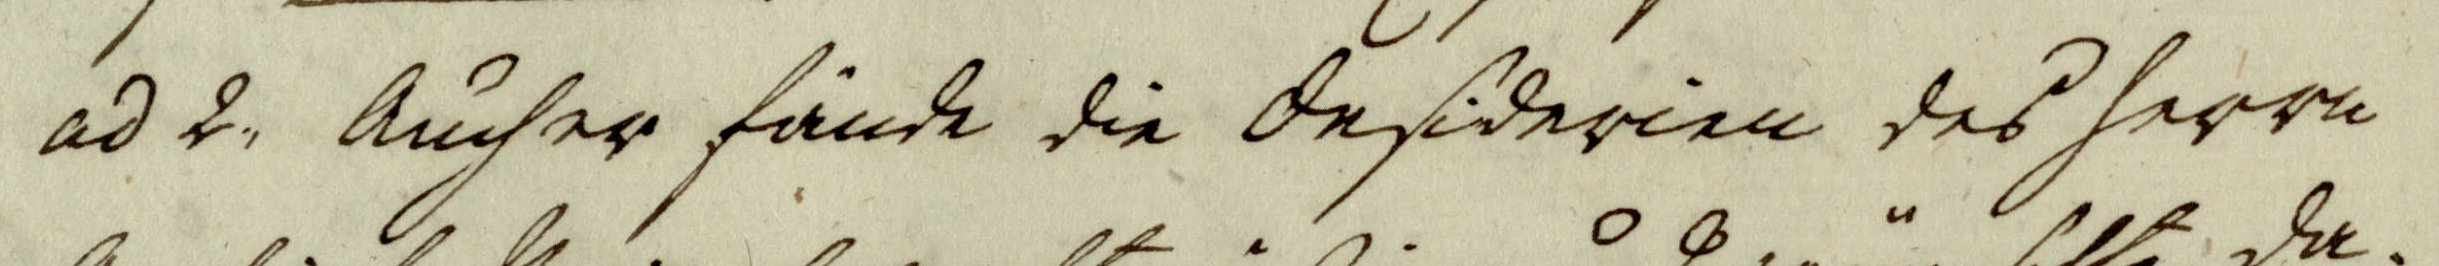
ad 2., Auch er fände die Desiderien des Herrn
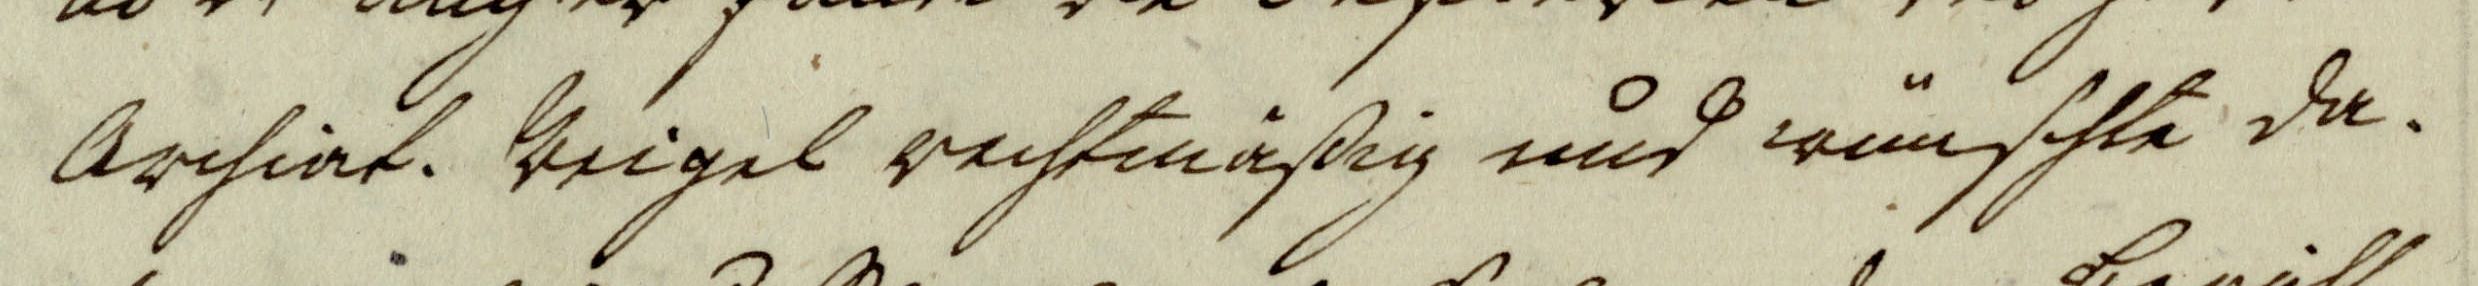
Archiat. Weigel rechtmäßig und wünschte da¬
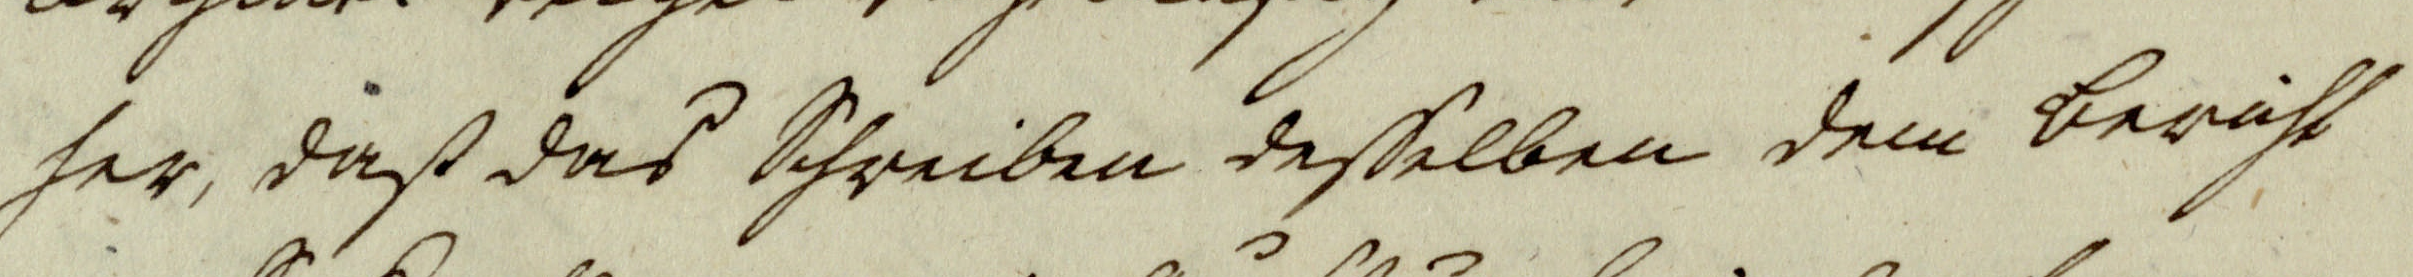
her, daß das Schreiben desselben dem Bericht
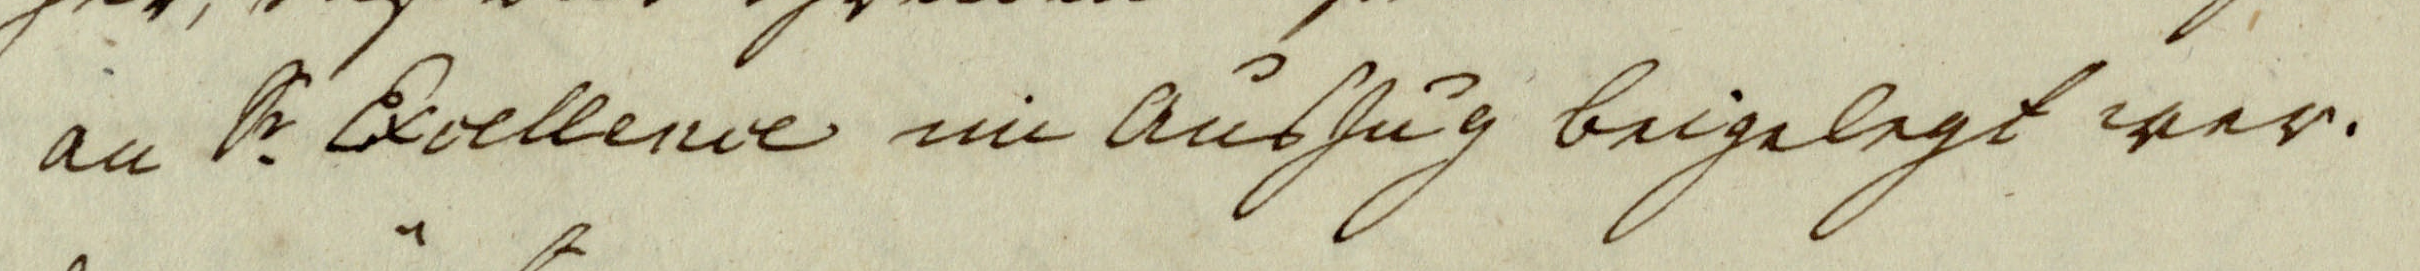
an Sr. Excellence im Auszug beigelegt wer¬
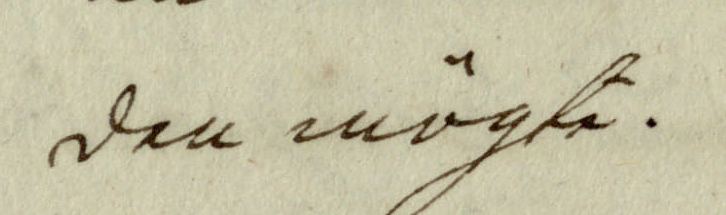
den mögte.
